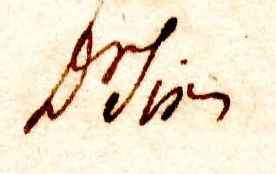D^r Sir
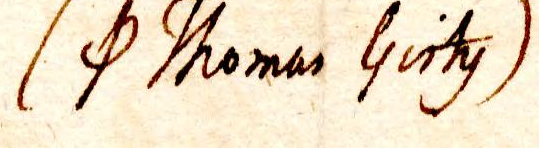(per Thomas Girty)
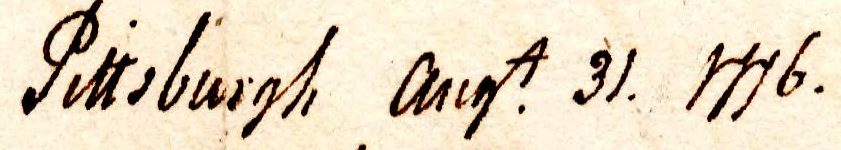Pittsburgh Aug^t. 31. 1776.
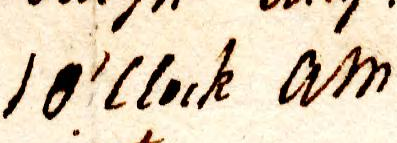10'Clock AM.
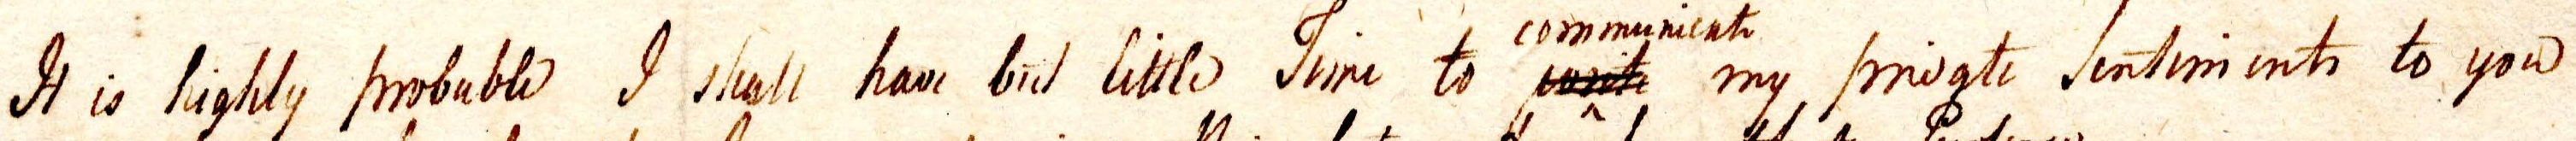It is highly probable I shall have but little Time to write ^ my private Sentiments to you
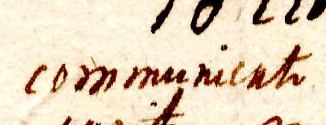communicate
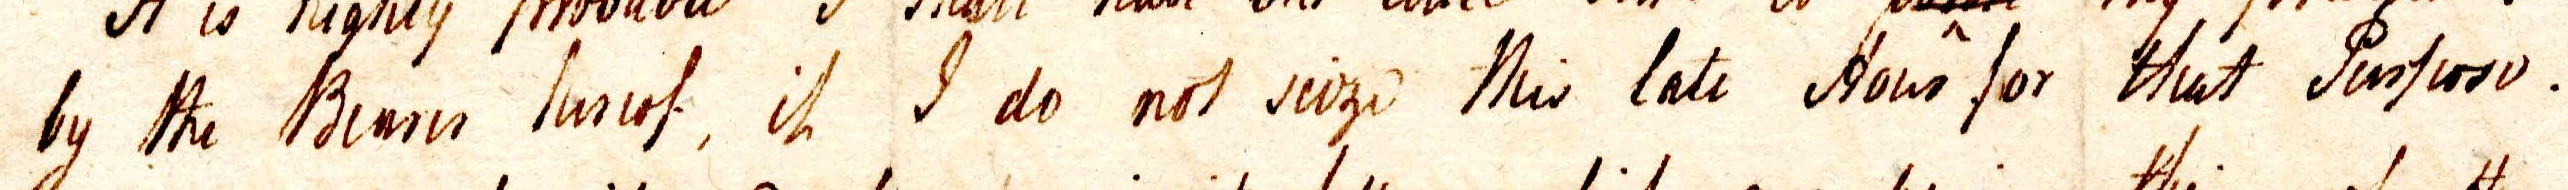by the Bearers hereof, if I do not seize this late Hour for that Purpose.
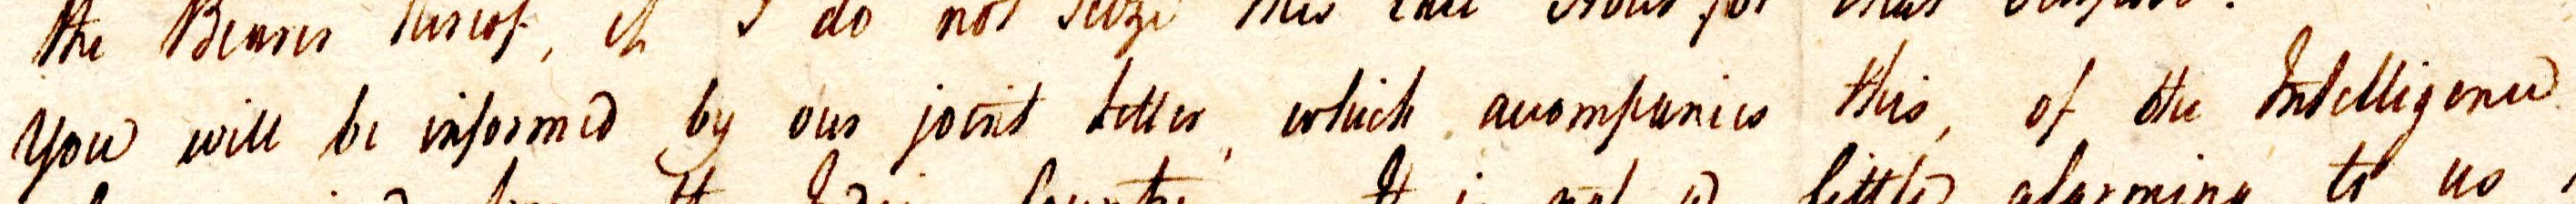You will be informed by our joint Letter, which accompanies this, of the Intelligence
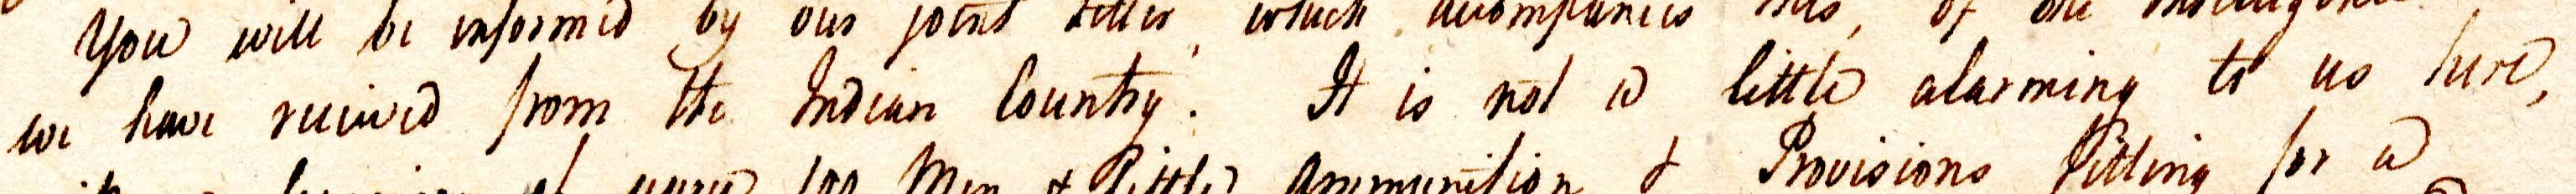we have received from the Indian Country. It is not a little alarming to us here,
